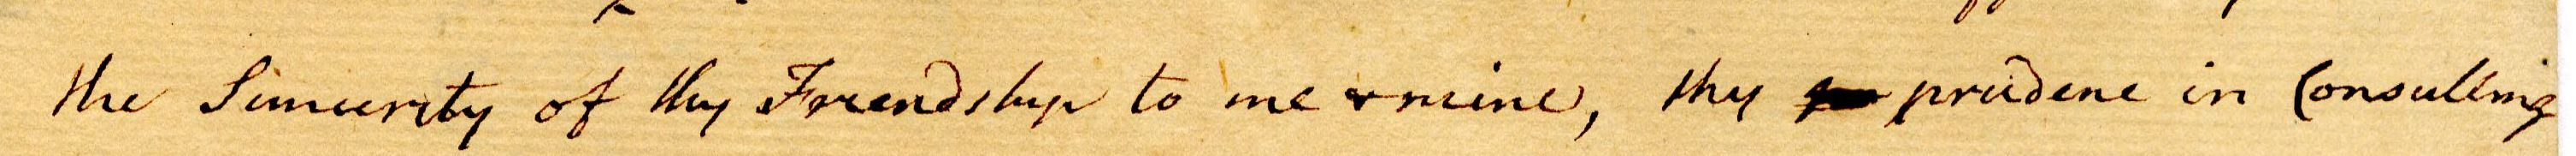the sincerity of thy Friendship to me & mine, thy [__] prudene in Consulting
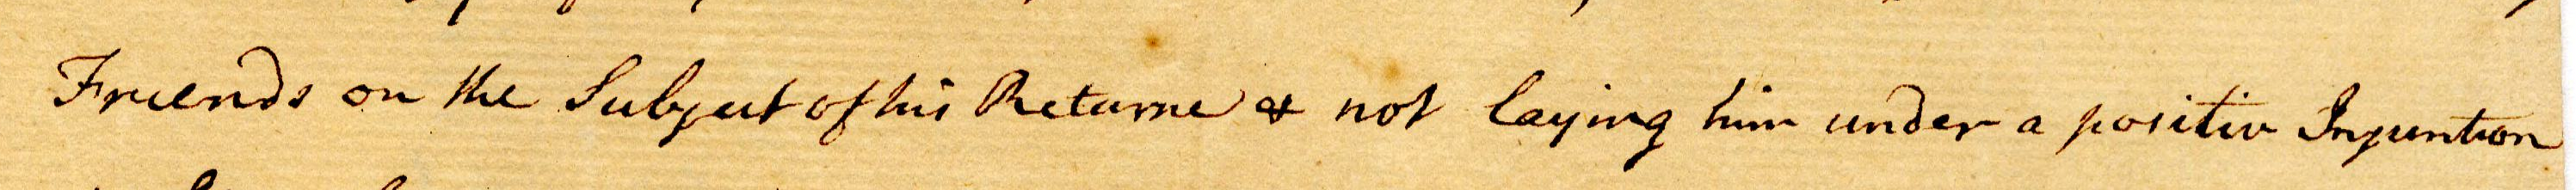Friends on the Subject of his Returne & not laying him under a positive Symtom
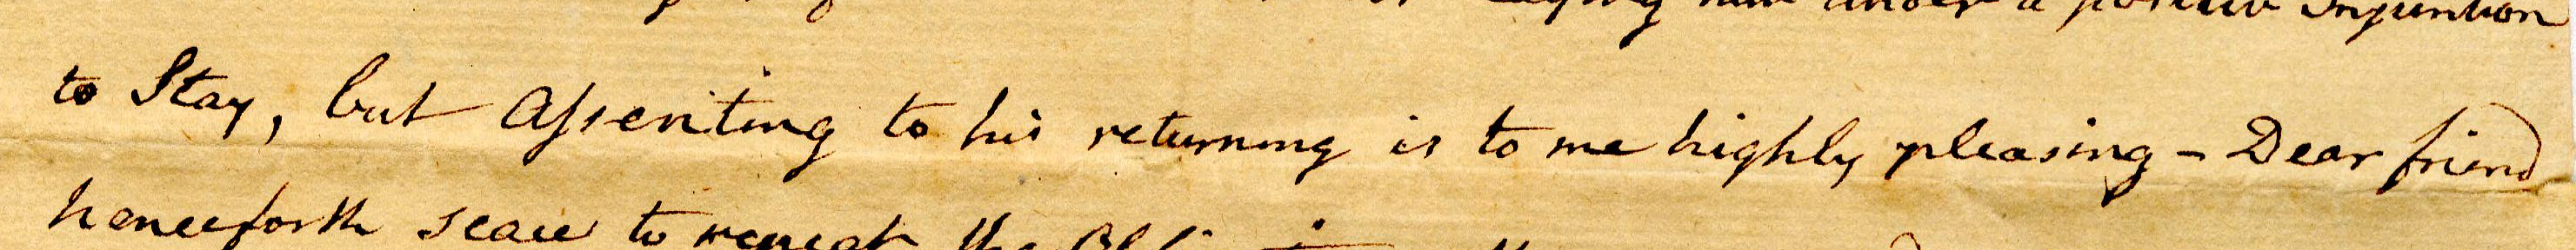to Stay, but Assenting to his returning is to me highly pleasing- Dear friend
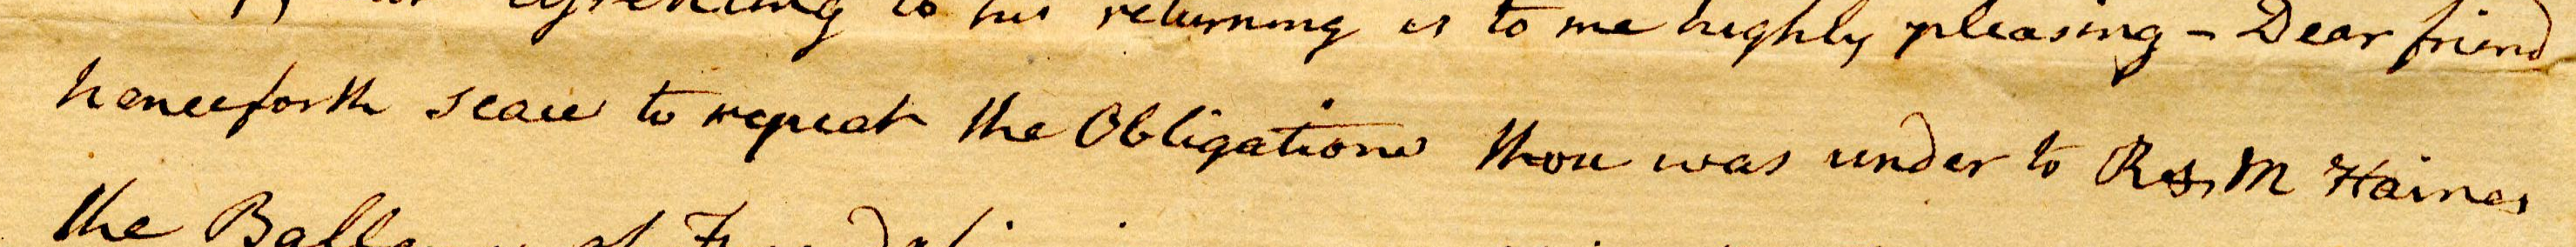henceforth seace to repeat the Obligations thee was under to R.s M Haines
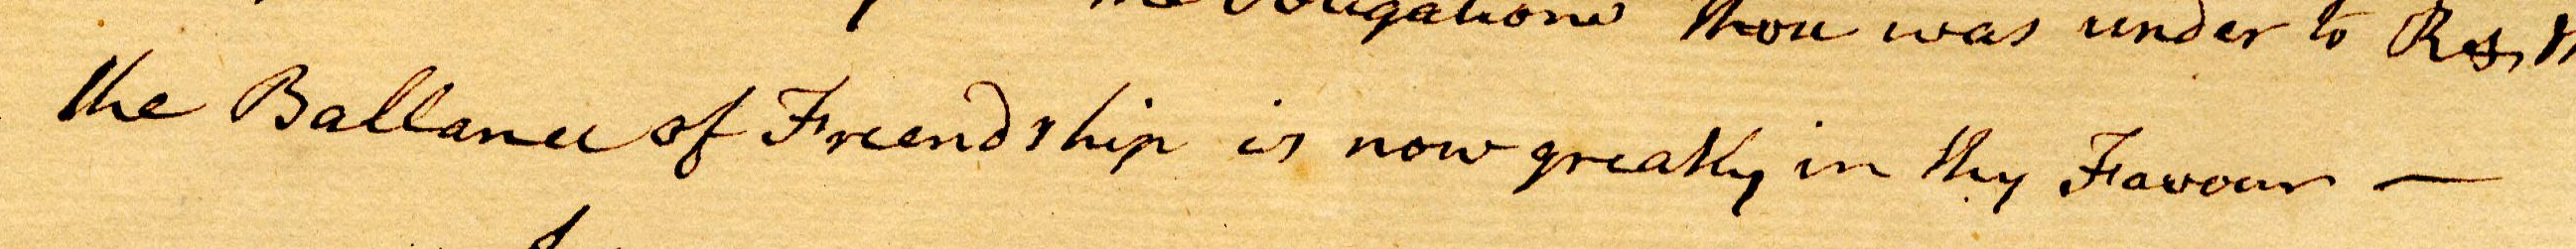the Ballance of Friendship is now greatly in thy Favour-
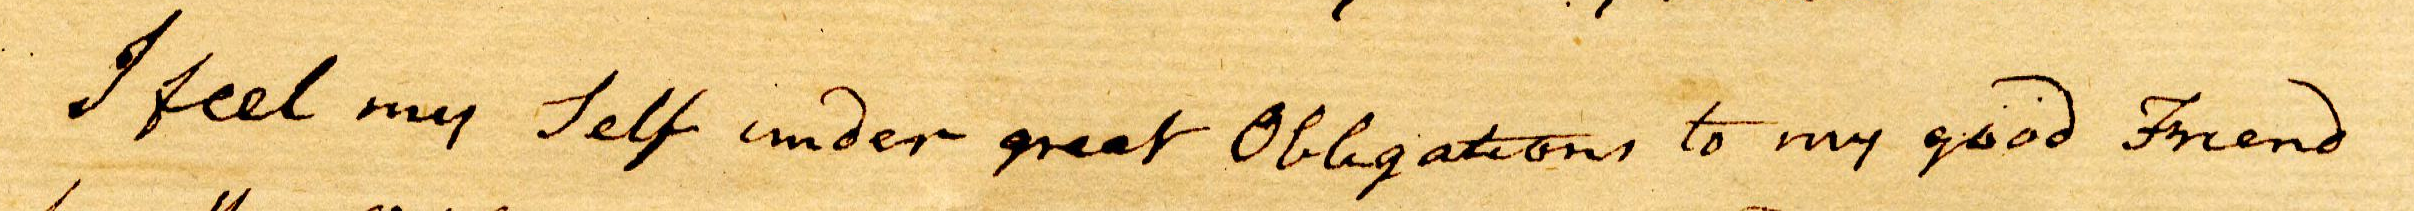I feel my self under great Obligations to my good Friend
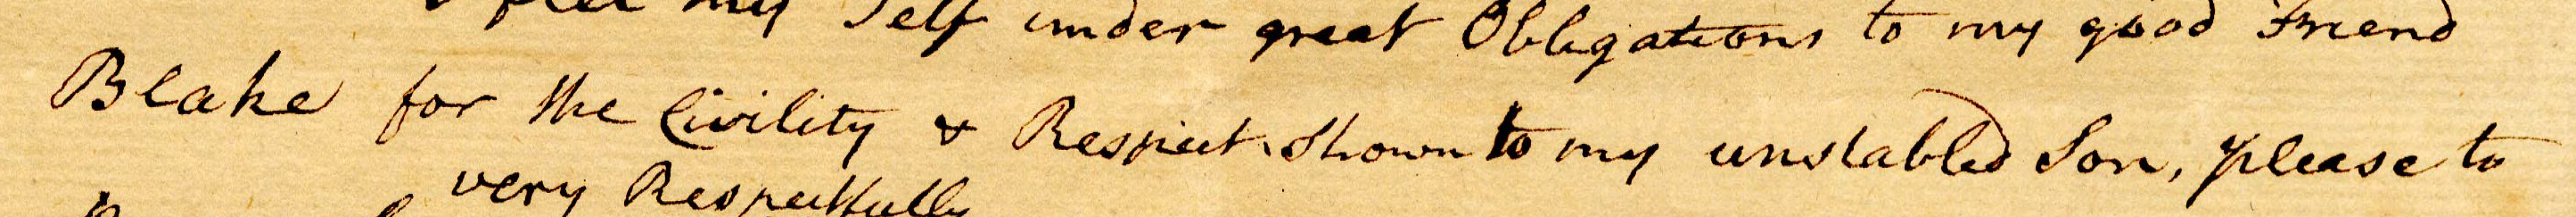Blake for the Civility & Respect shown to my unstabled son, please to
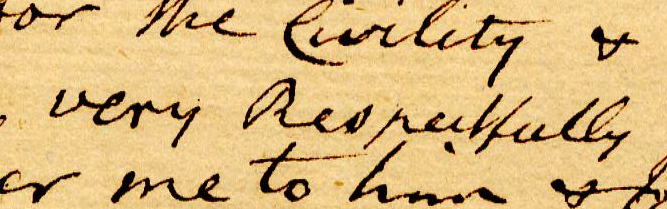very Respectfully
